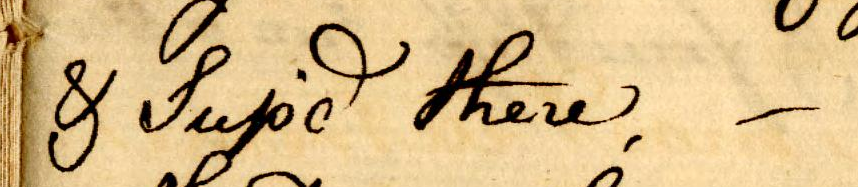& Sup'd there,-
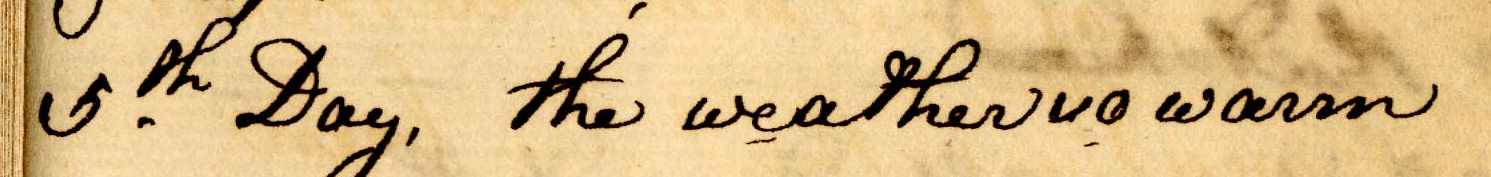5^th Day, the weather so warm
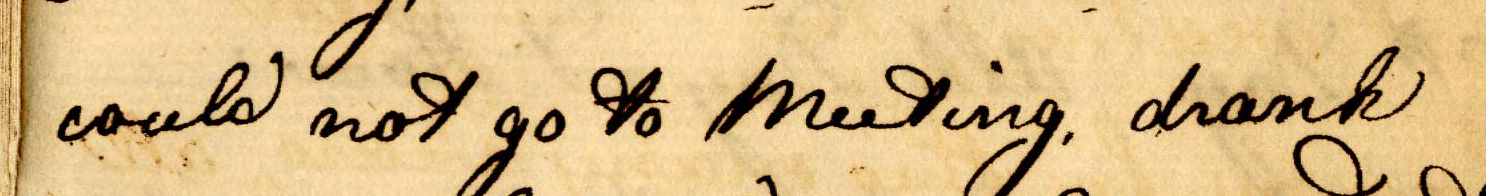could not go to Meeting, drank
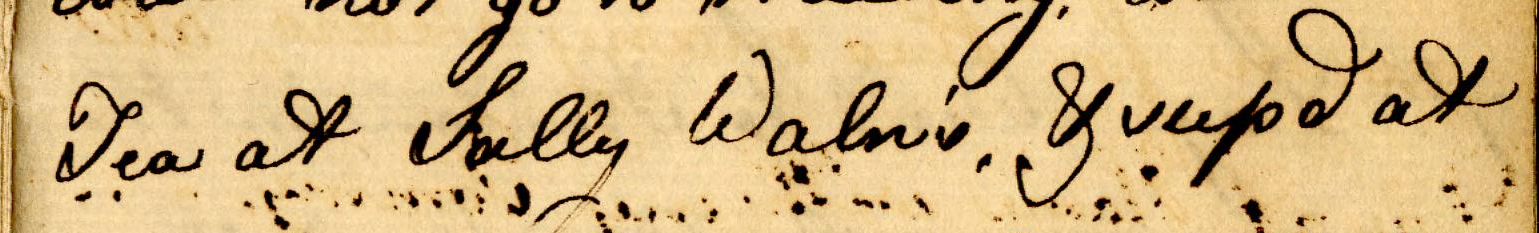Tea at Sally Waln's & sup'd at
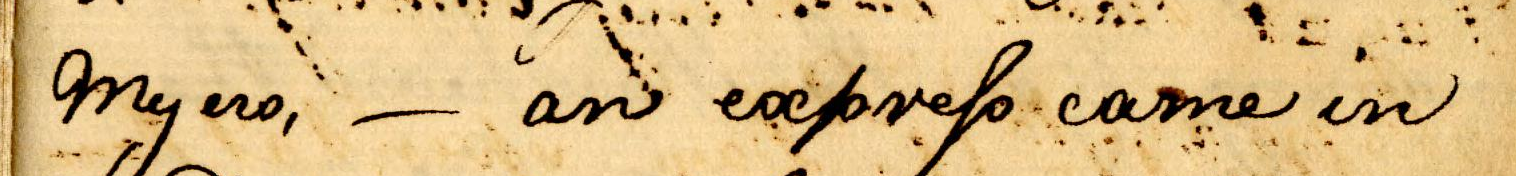Myers,- an express came in
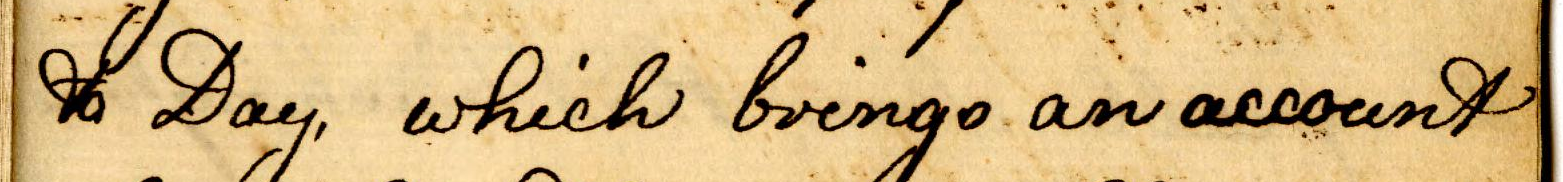to Day, which brings an account
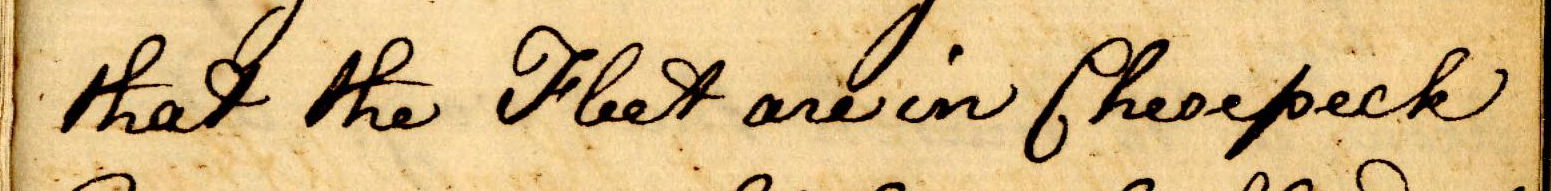that the Fleet are in Chesepeck
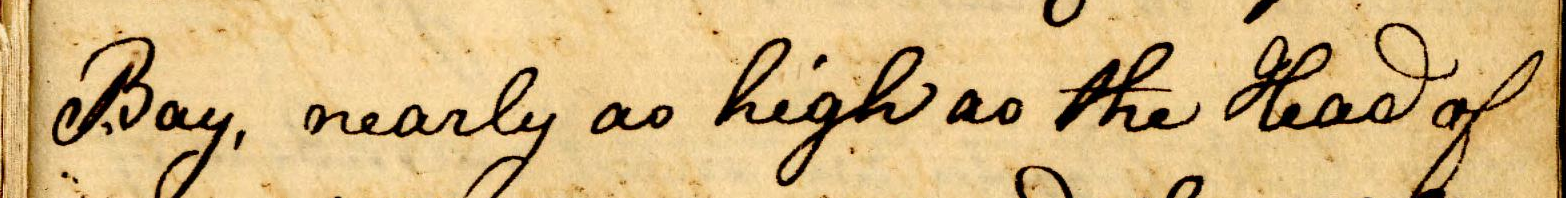Bay, nearly as high as the Head of
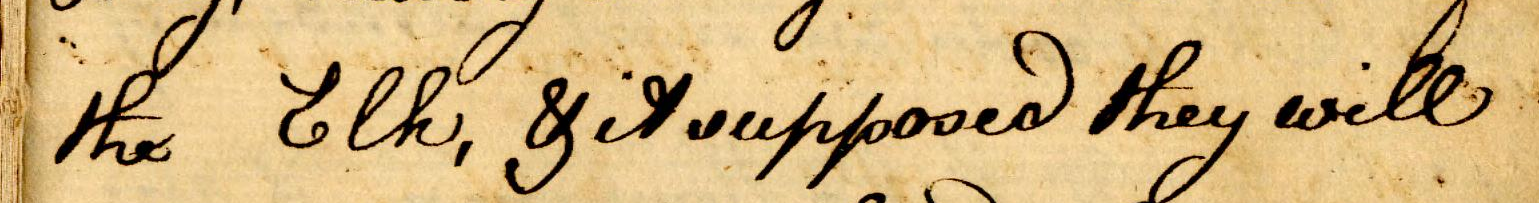the Elk, & it supported they will
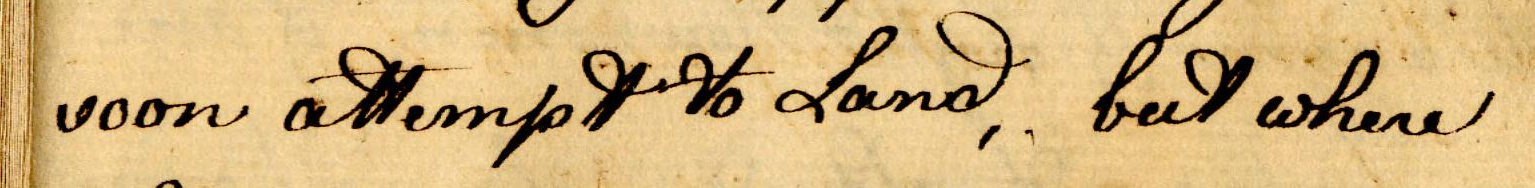soon attempt to Land, but where
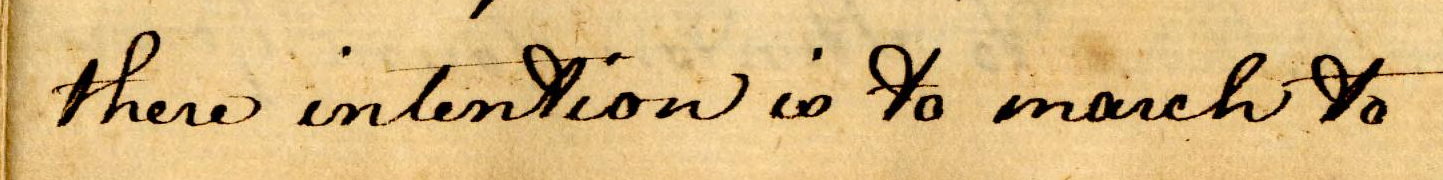there intention is to march to
